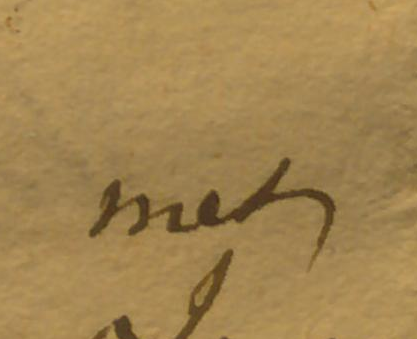met
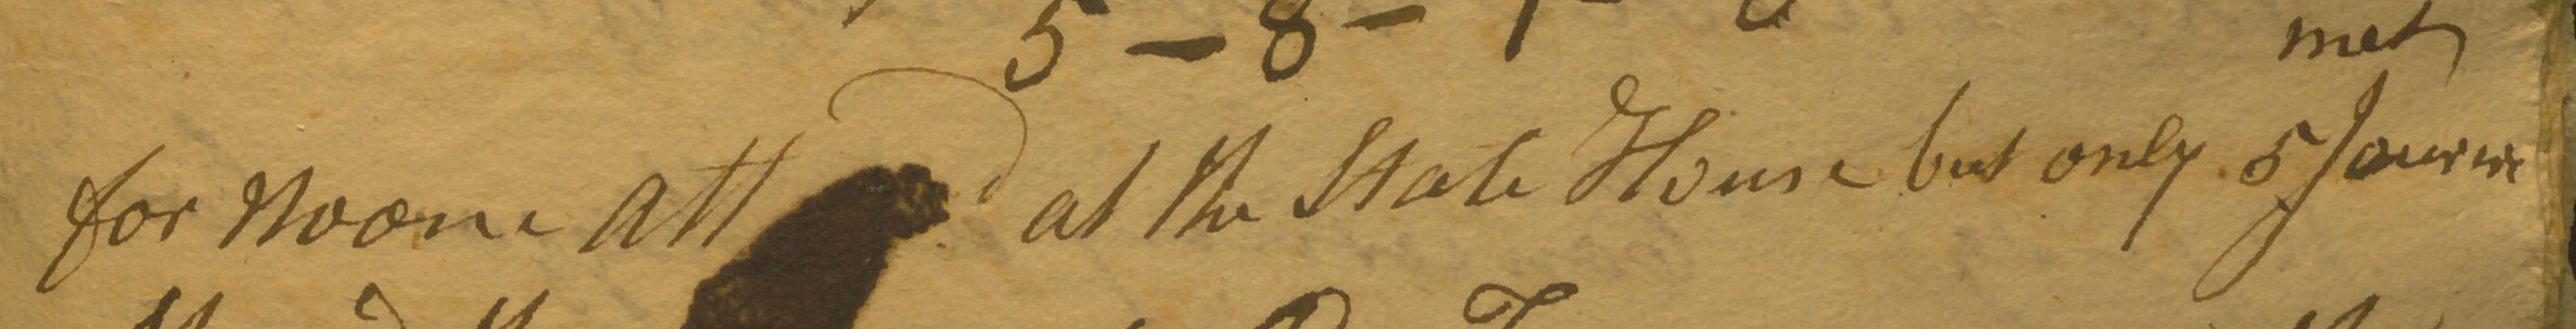for No one att at the State House but only o ^ James
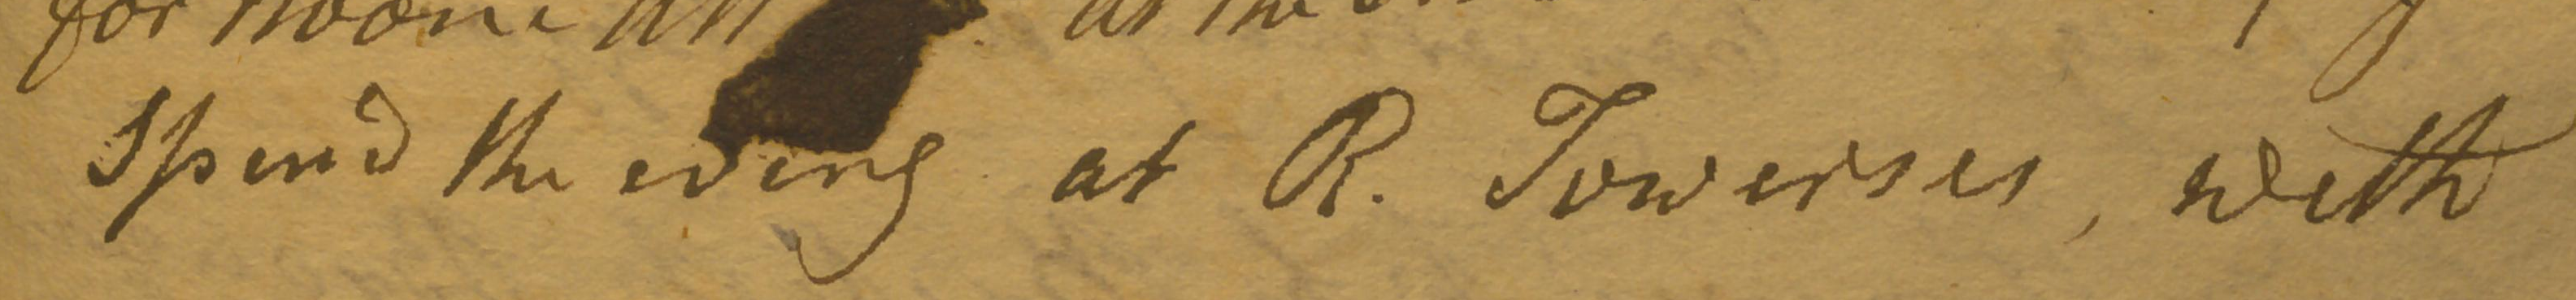spend the eving at R. Towerses, with
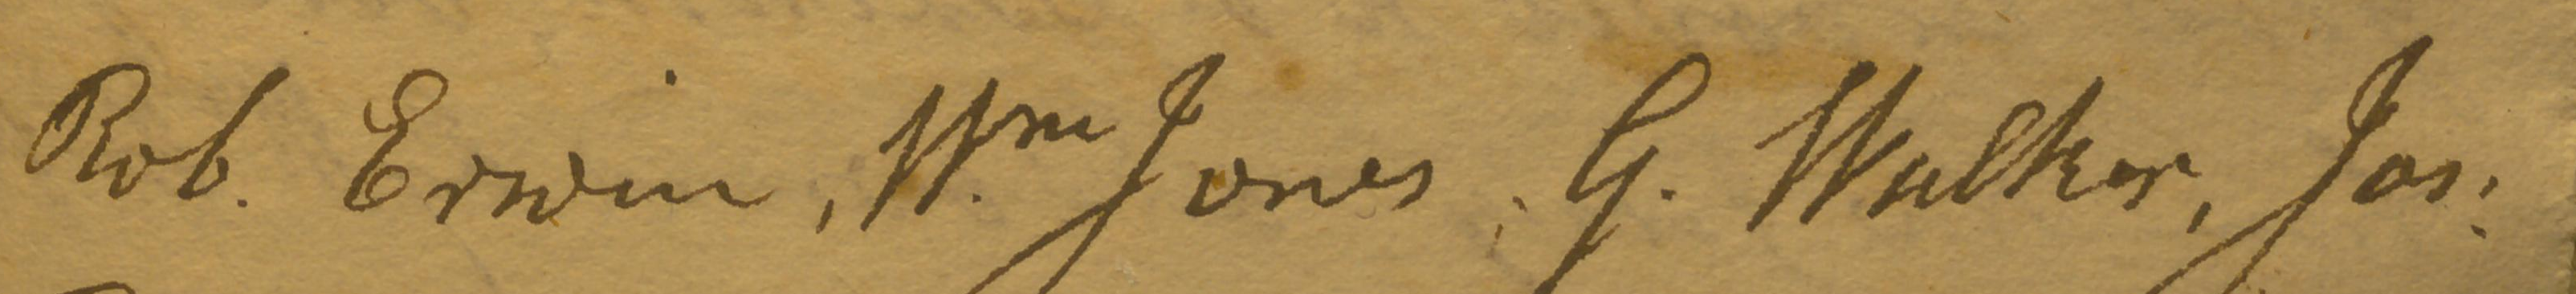Rob. Erwin, W^m Jones G. Walker, Jas.
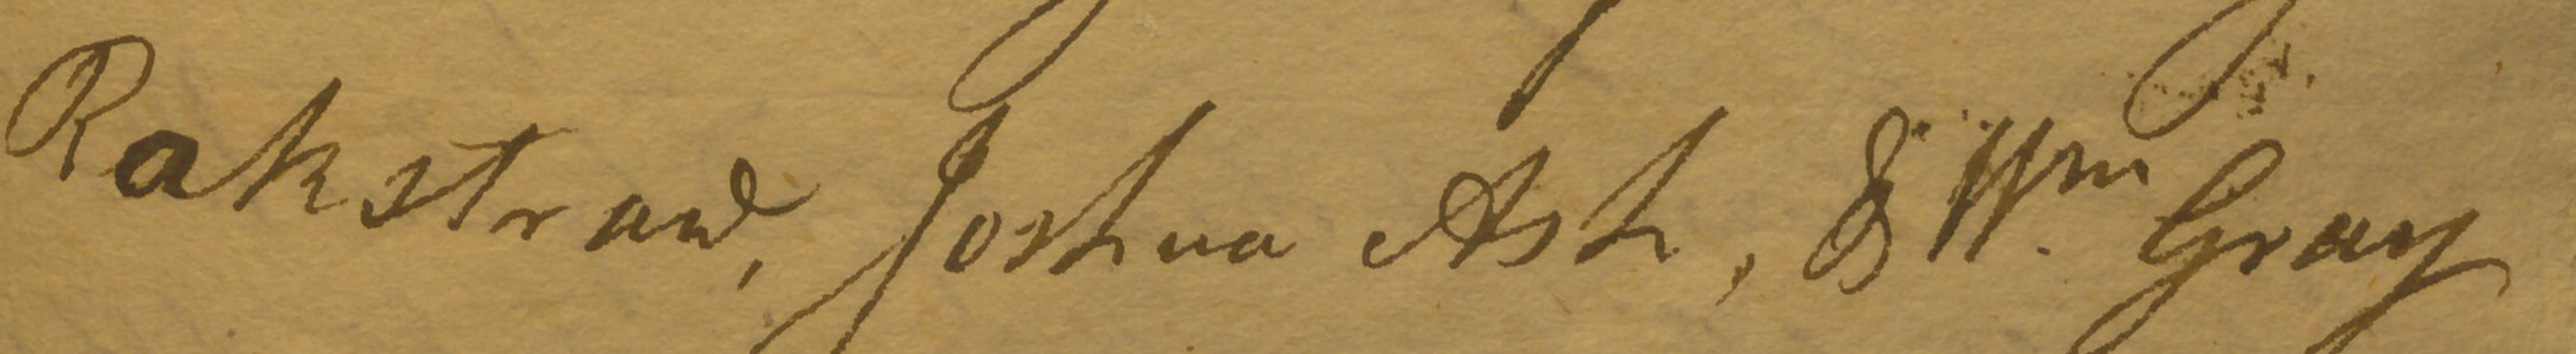Rakstraw Joshua Ash, & W^m. Gray
